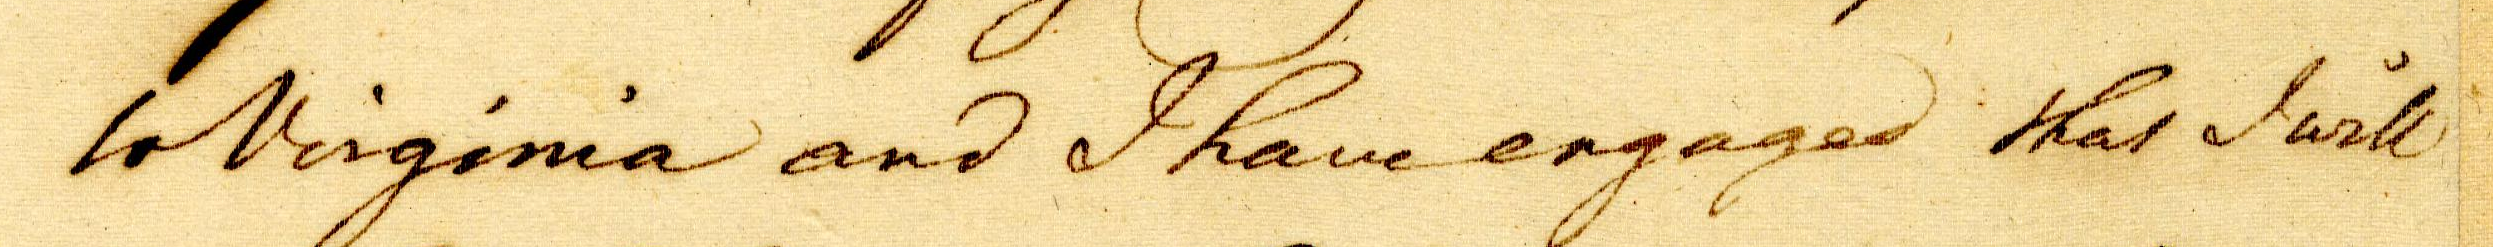to Virginia and I have engaged that I will
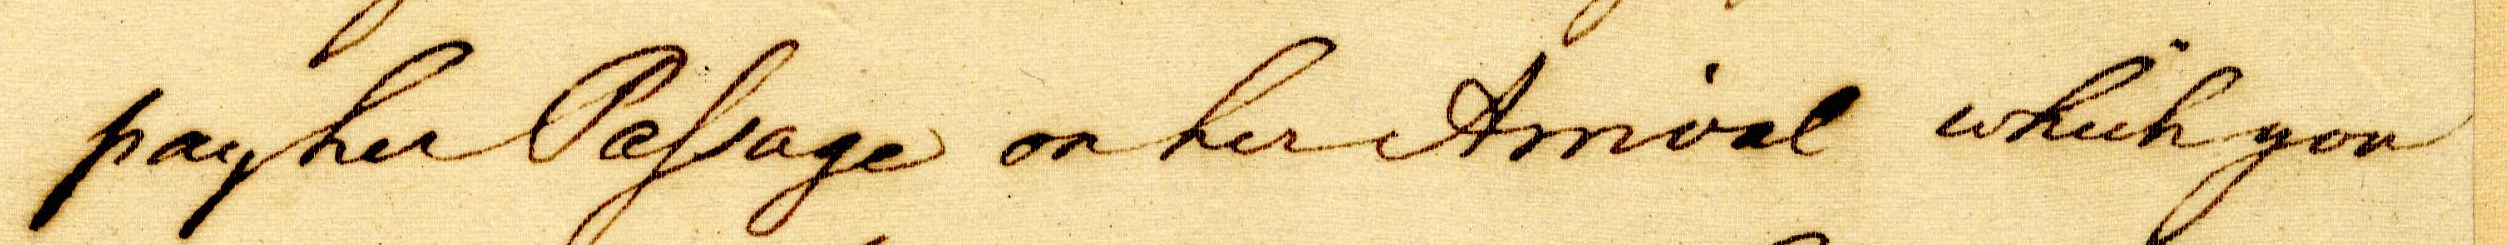pay her Passage on her Arrival which you
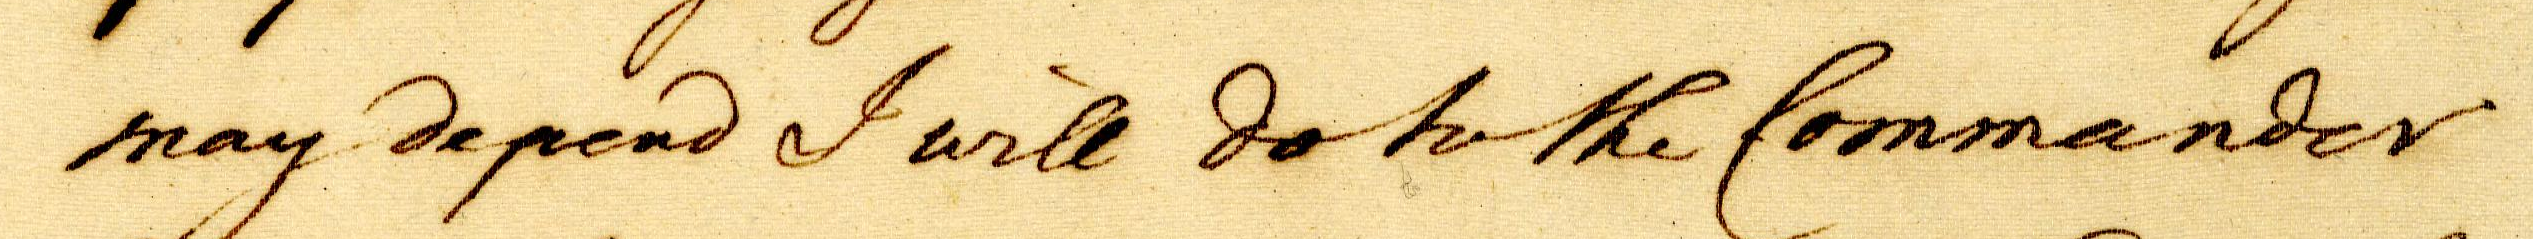may depend I will do to the Commander
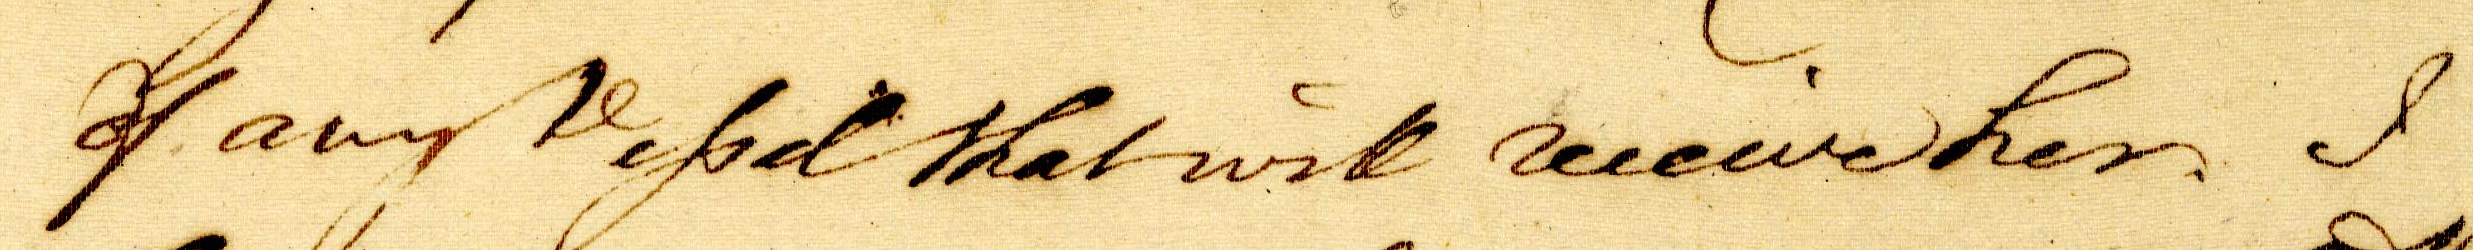of any Vessel that will receive her. I
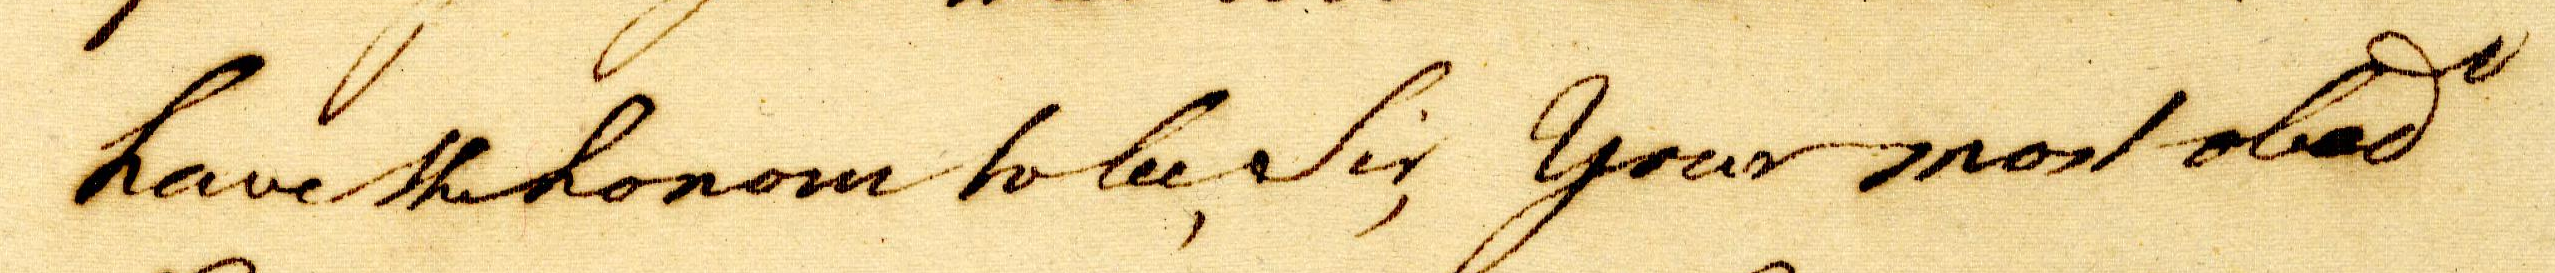have the honour to be, Sir, Your most obed^t
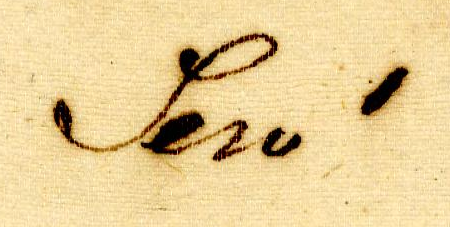Serv^t
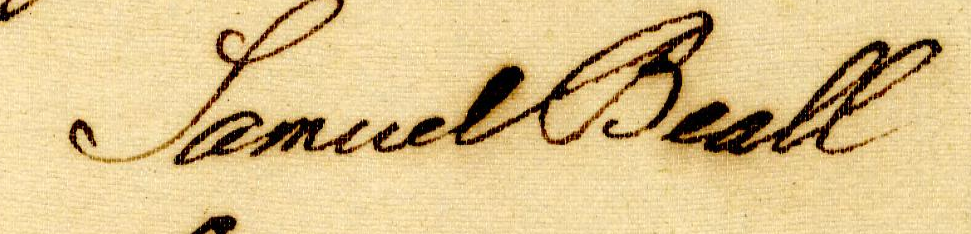Samuel Beall
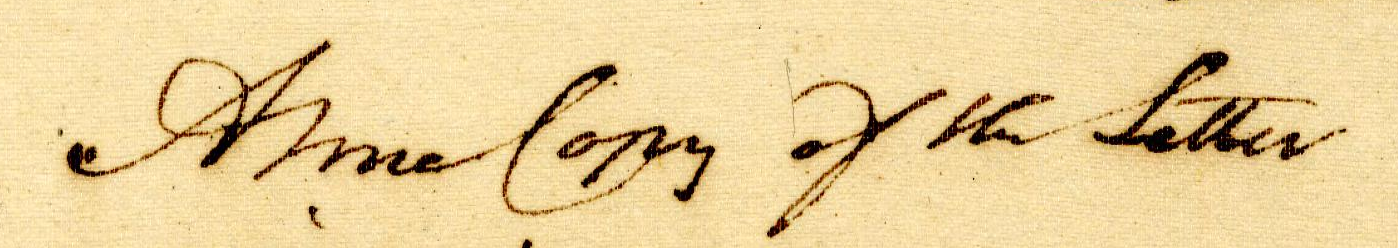A Copy of the Letter
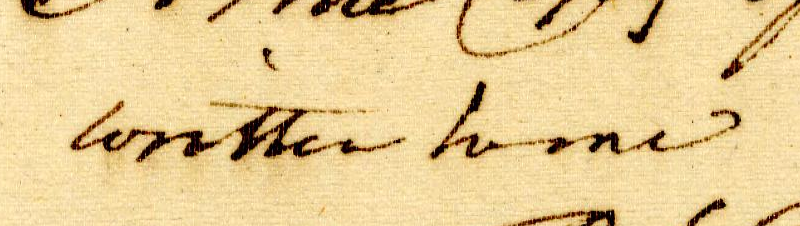written to me
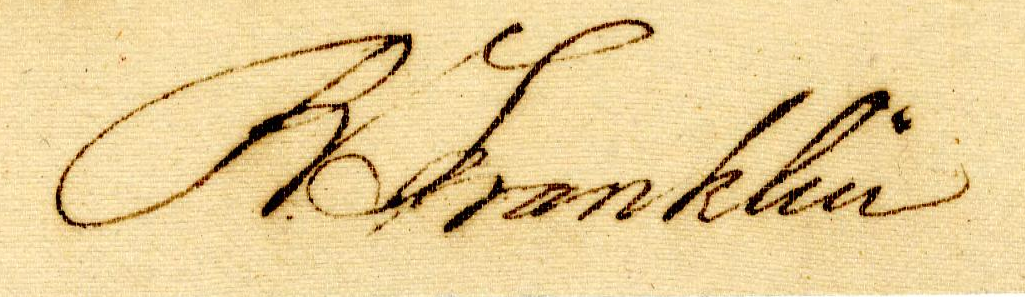B Franklin
